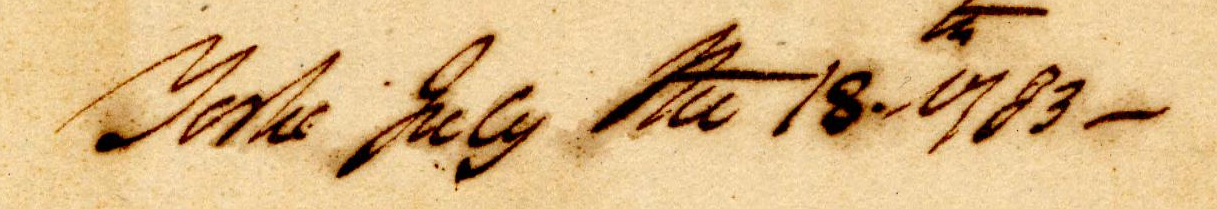York July the 18^th. 1783.
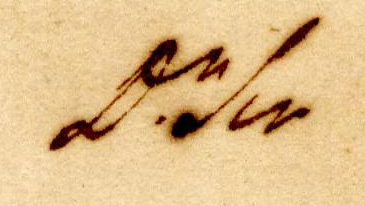D^r Sir
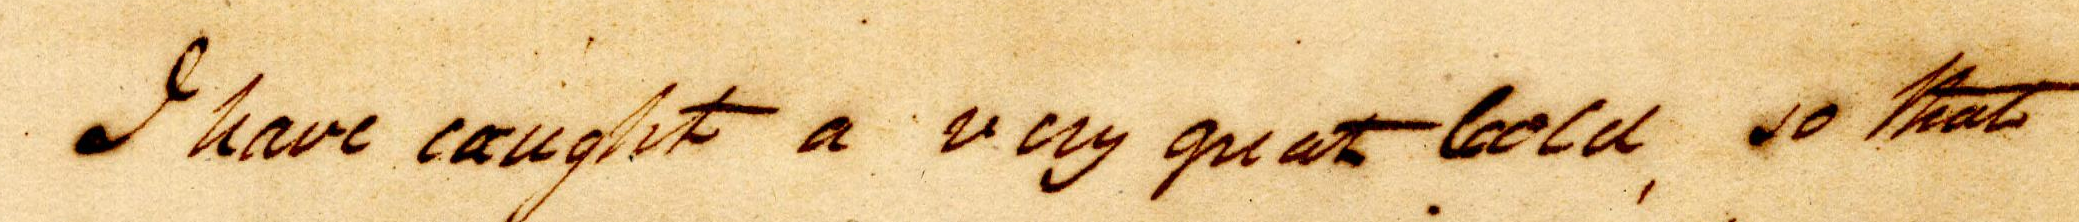I have caught a very great Cold so that
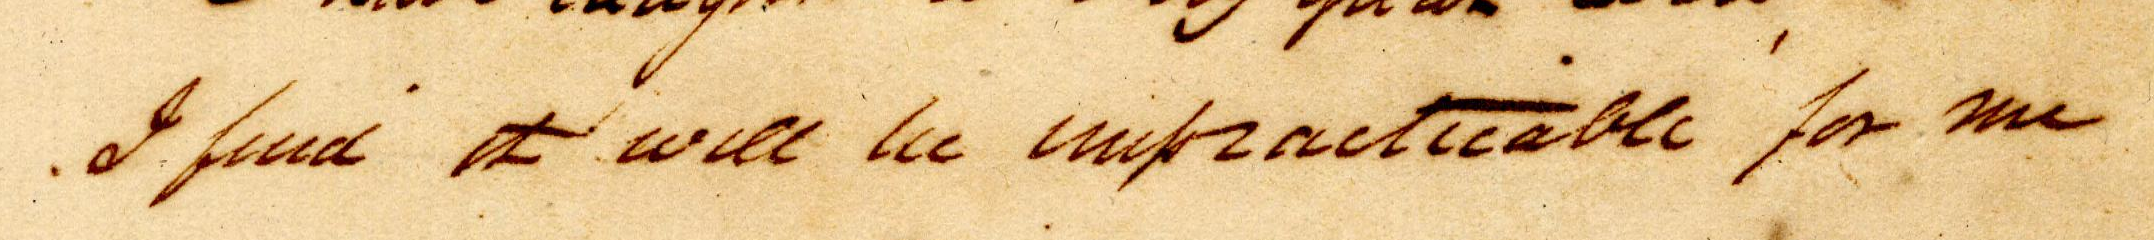I find it will be impracticable for me
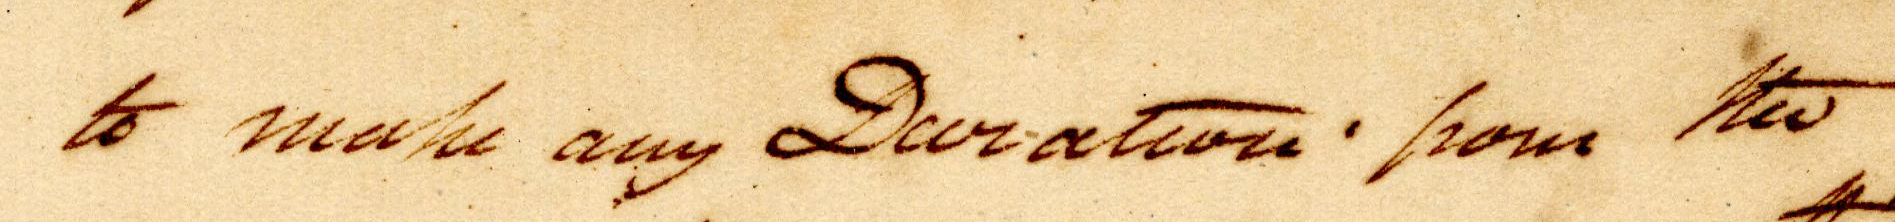to make any Duration from the
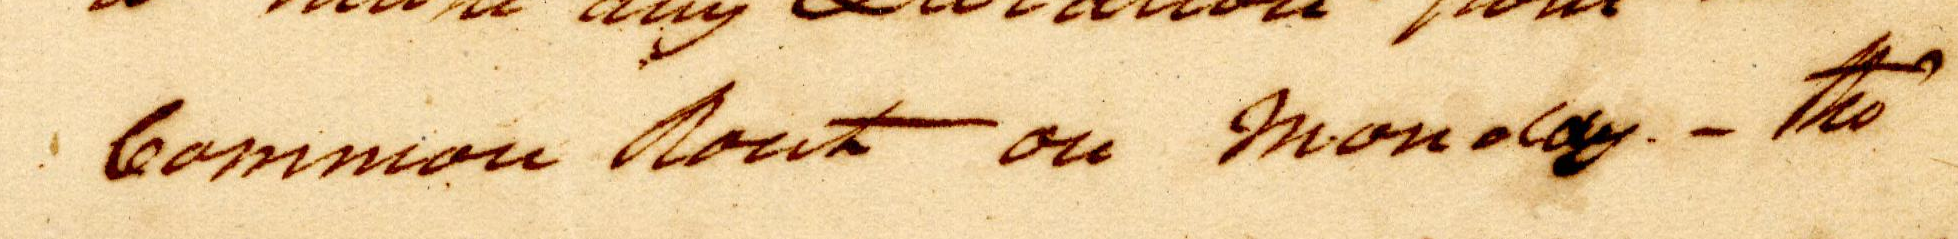Common Rout on Monday. Tho'
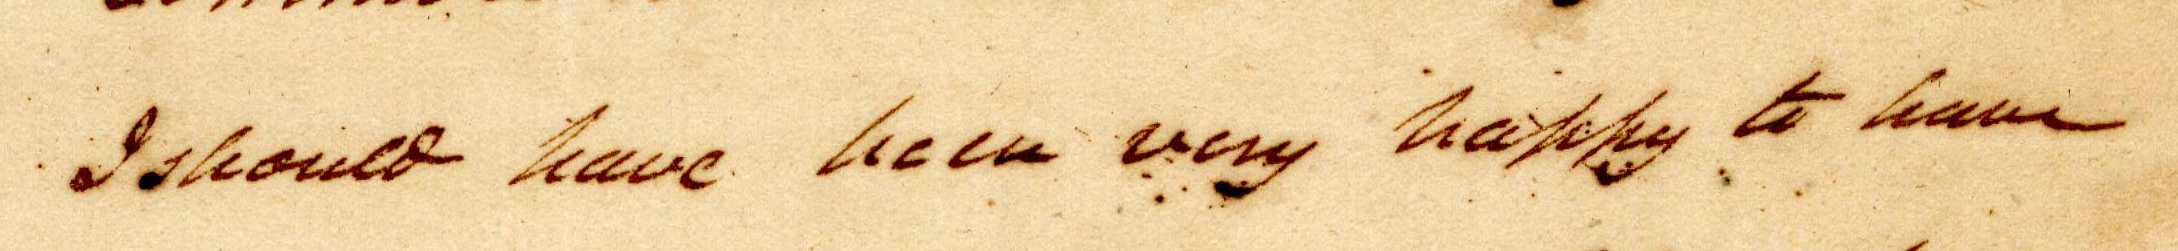I should have been very happy to have
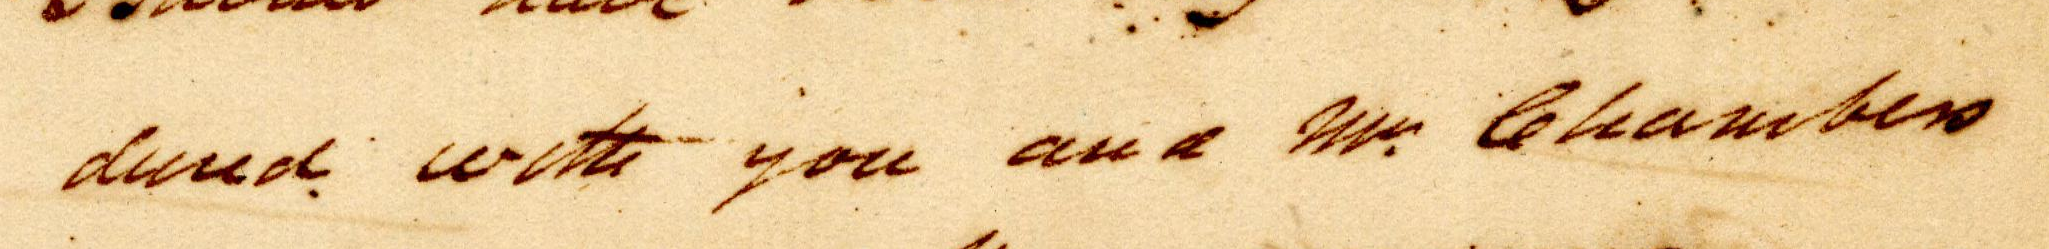dined with you and M^r. Chambers
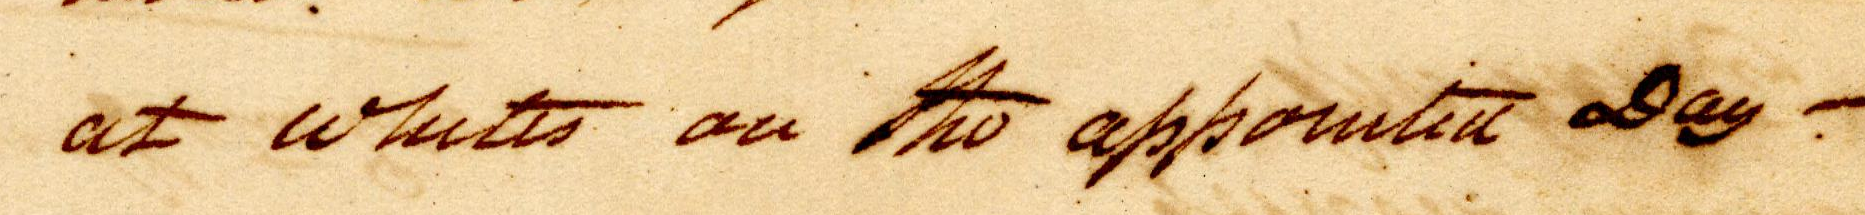at Whites on the appointed Day.
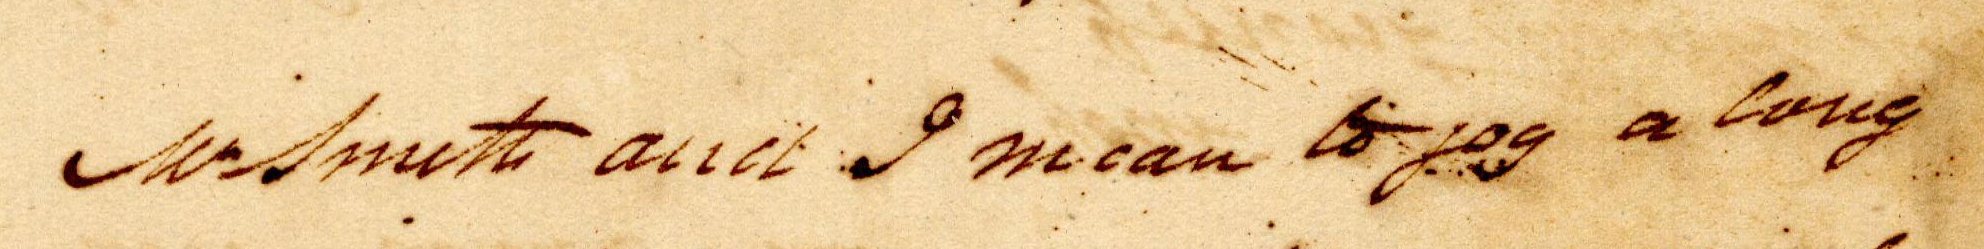M^r. Smith and I mean to jog a long
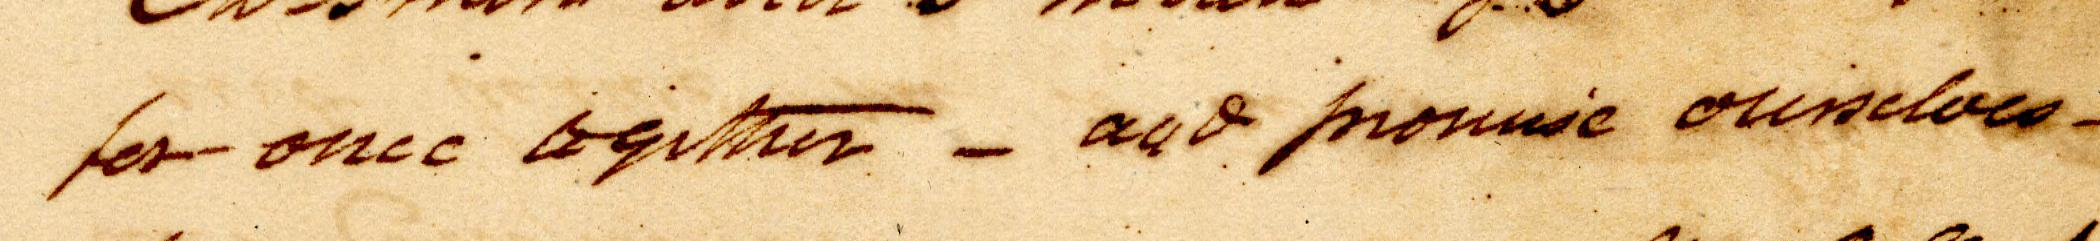for once together, and promise ourselves
